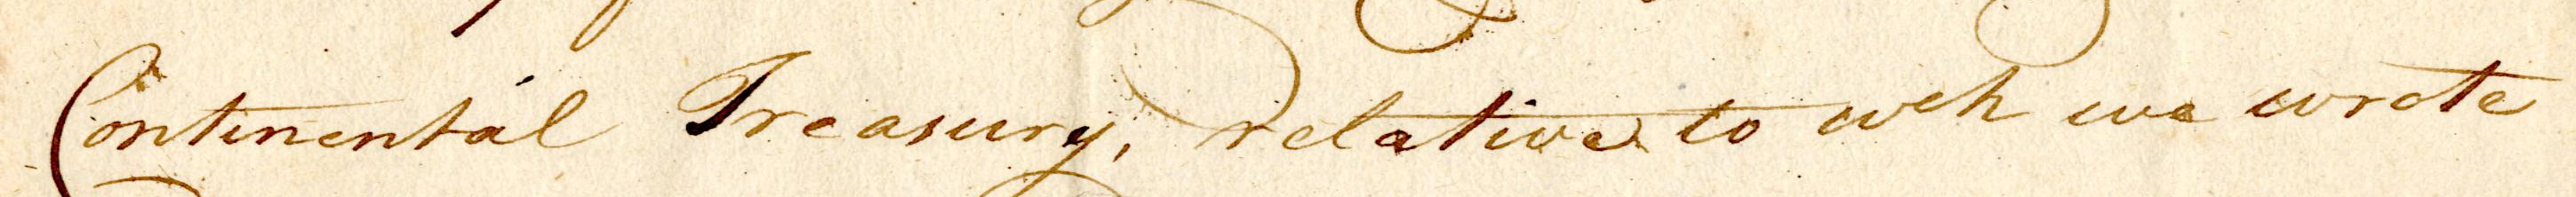Continental Treasury, relative to w^ch we wrote
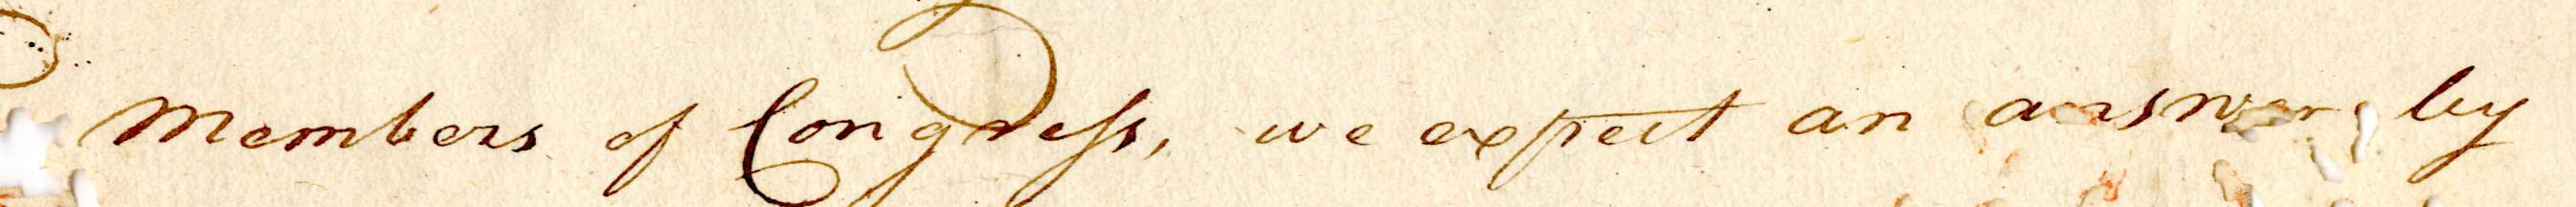Members of Congress, we expect an answer by
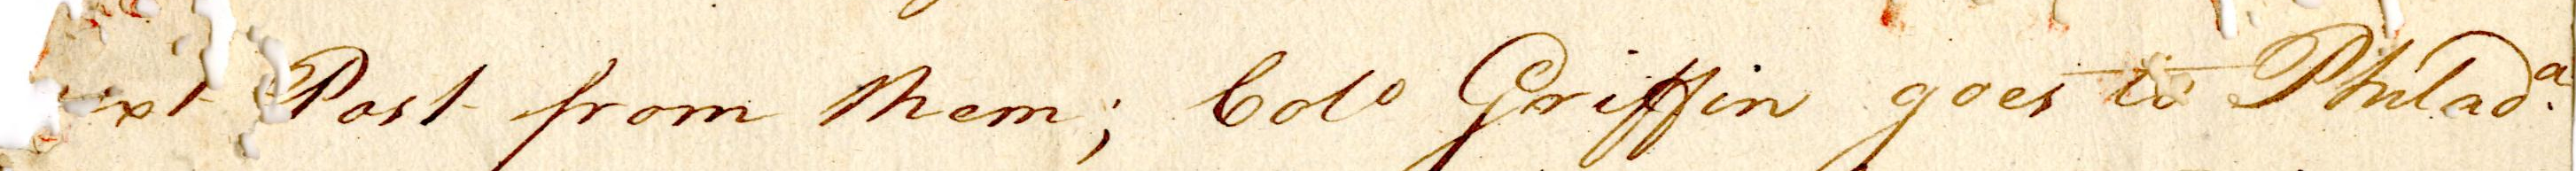next Post from them; Col^o Griffin goes to Philad^a
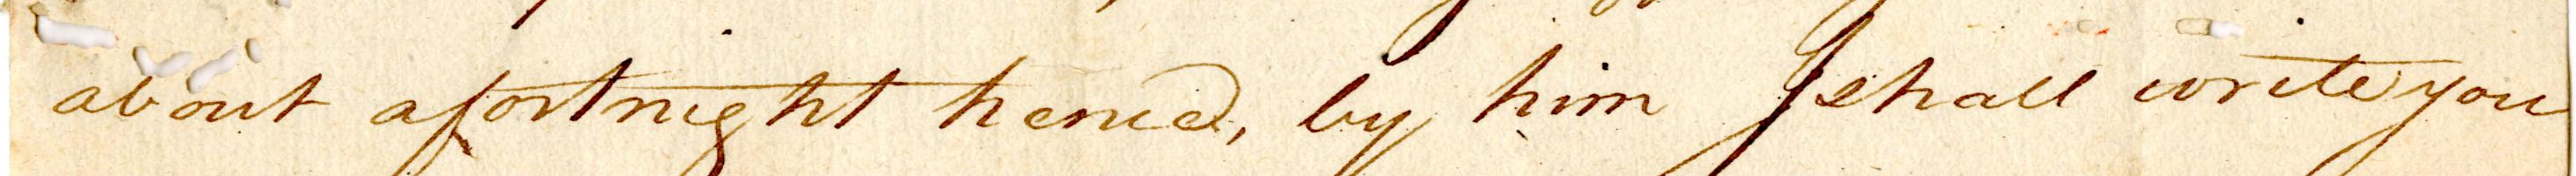about a fortnight hence, by him I shall write you
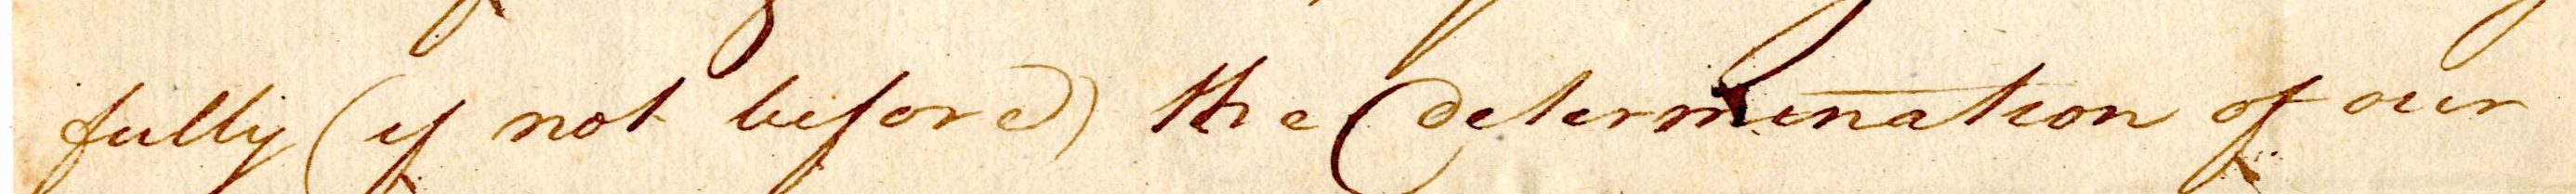fully (if not before) the determination of our
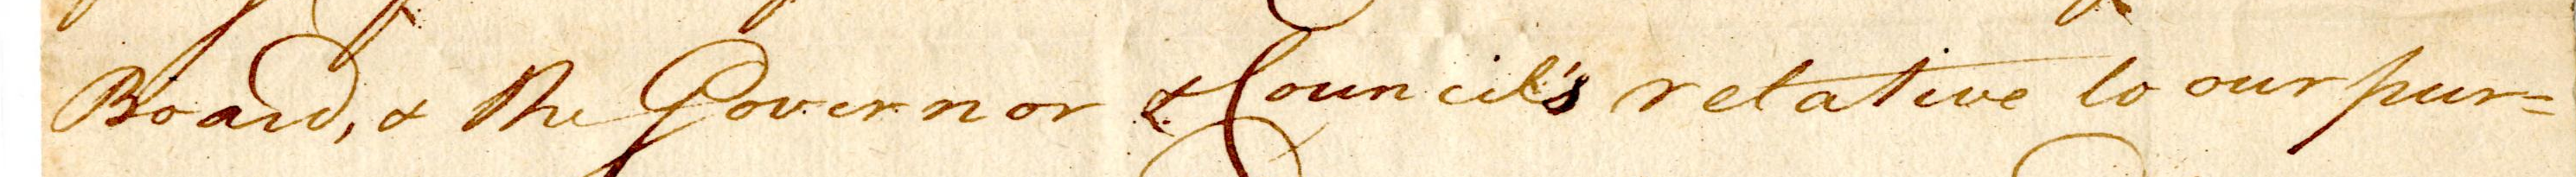Board, & the Governor & Councils relative to our pur-
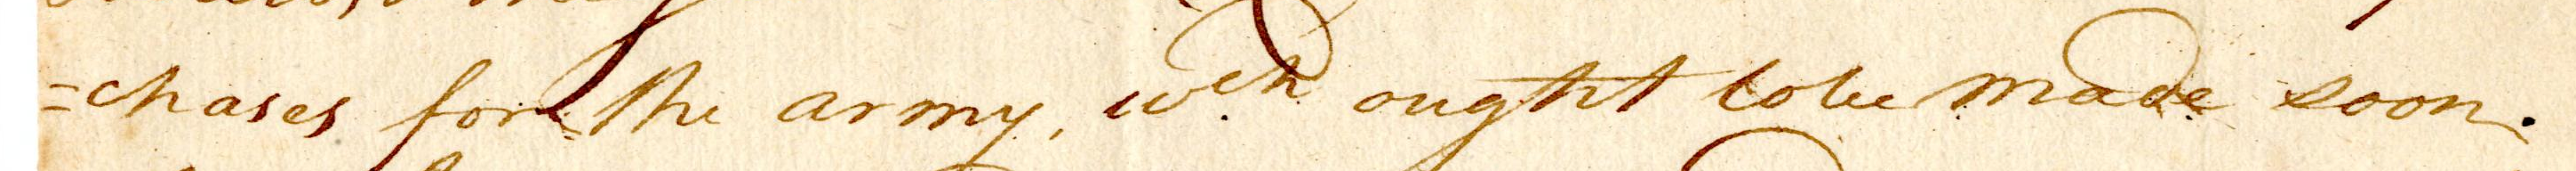-chases for the army w^ch. ought to be made soon.
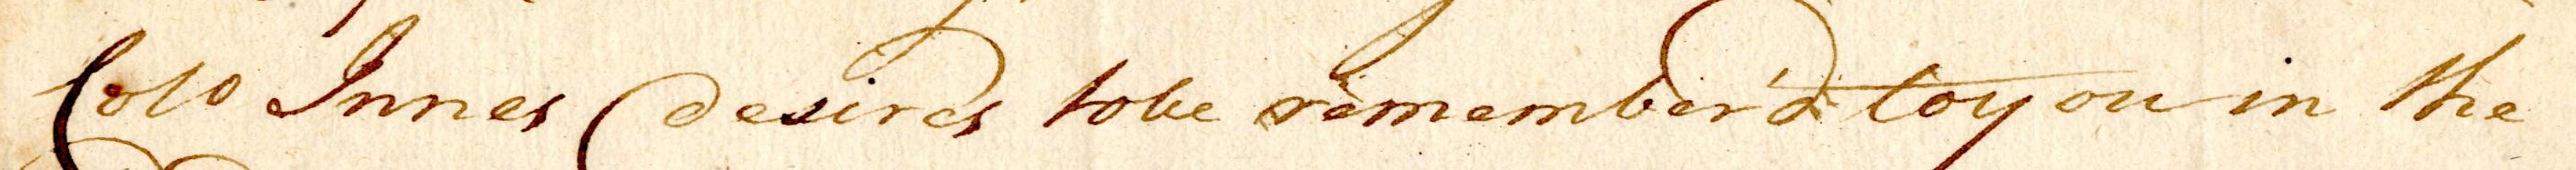Col^o Innes desires to be romember'd to you in the
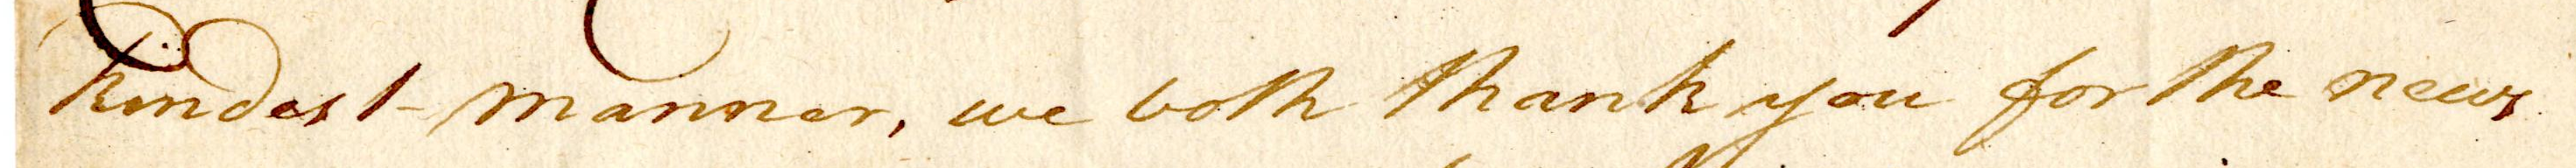Kindest manner, we both thank you for the news
